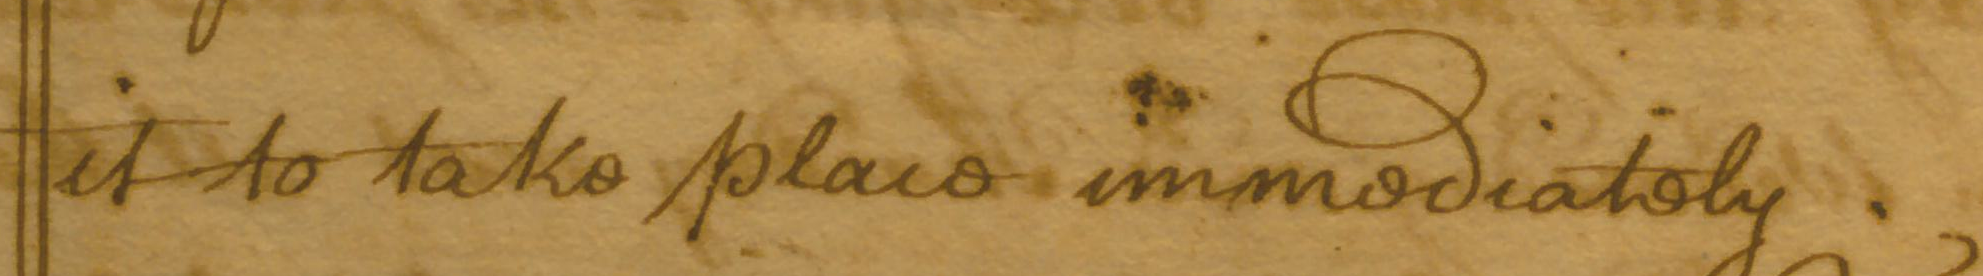it to take place immediately.
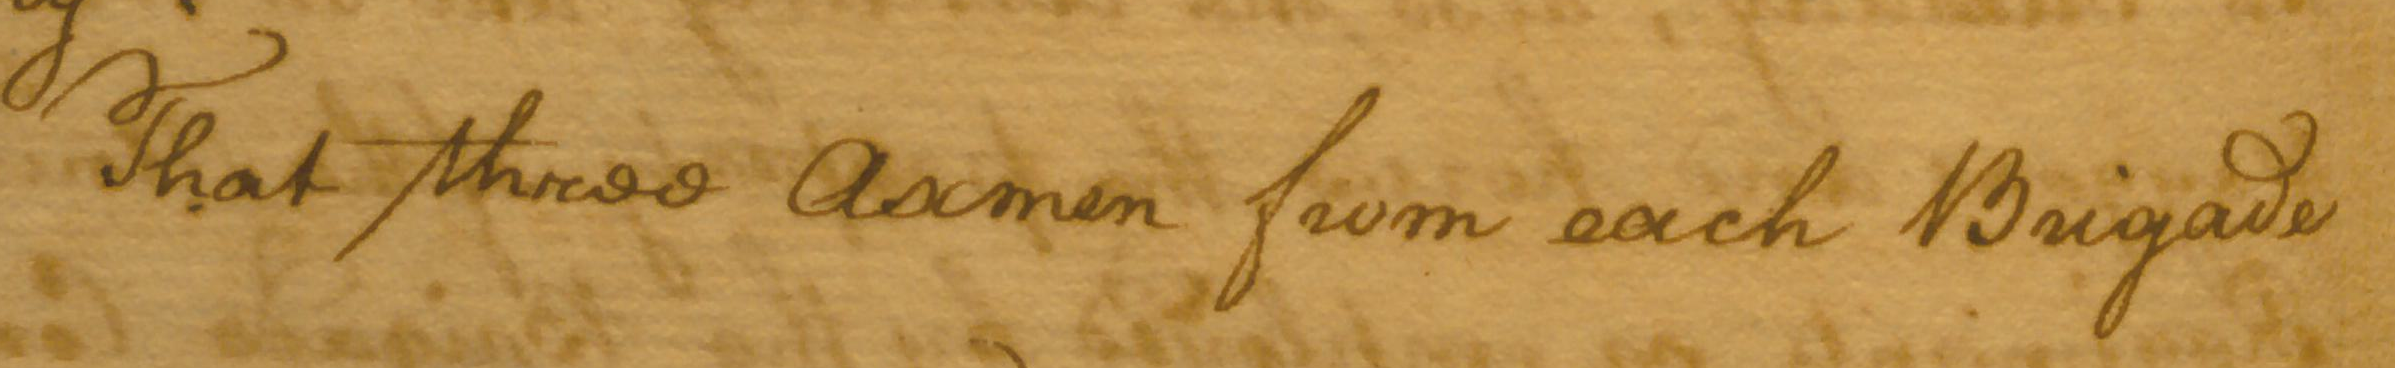That three Axmen from each Brigade
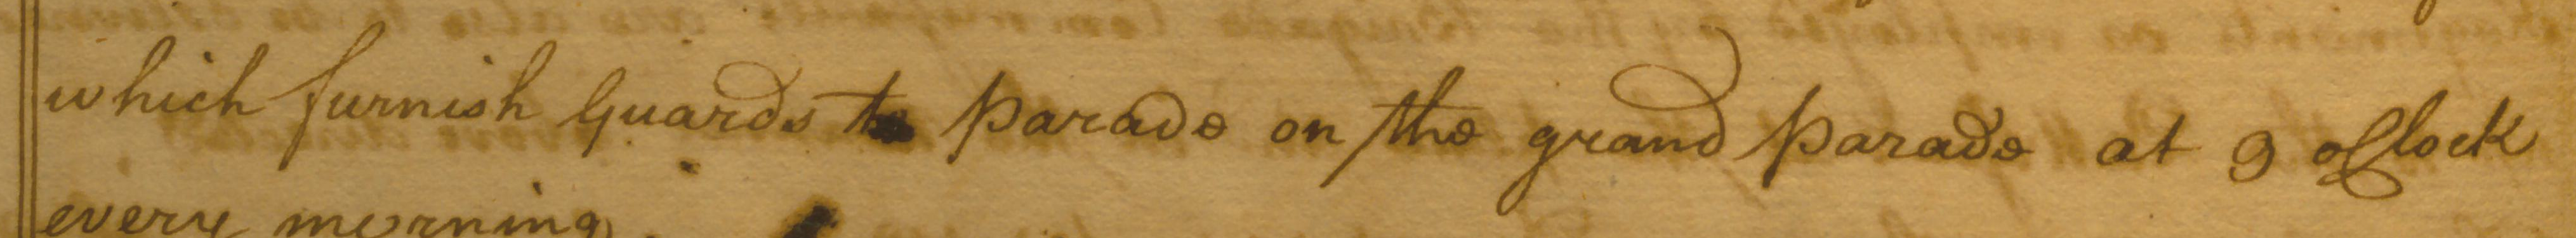which furnish Guards to parade on the grand parade at 9 oClock
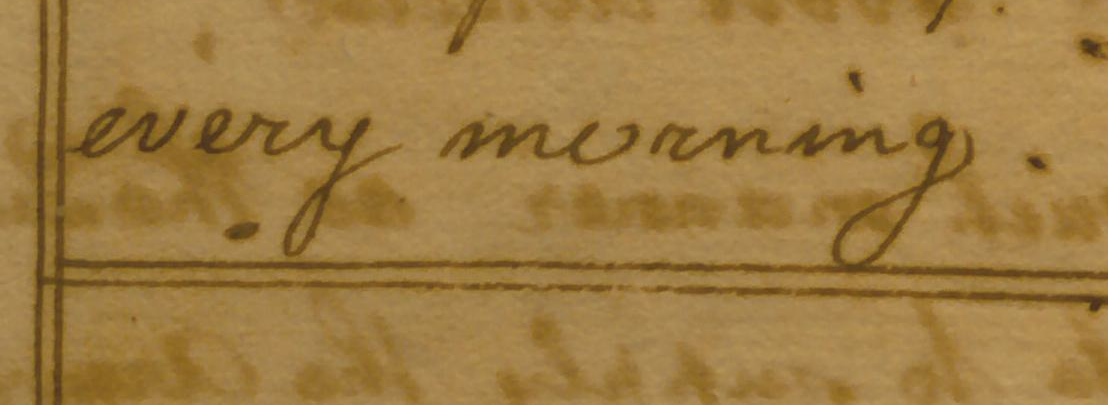every morning.
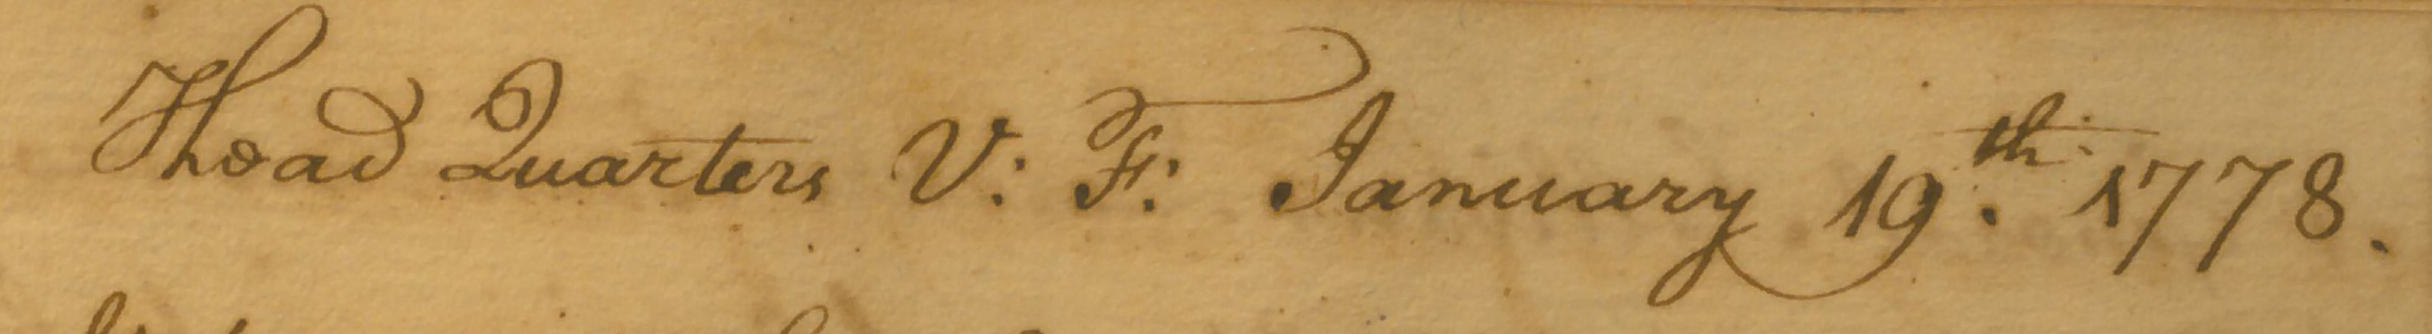Head Quarters V: F: January 19^th. 1778.
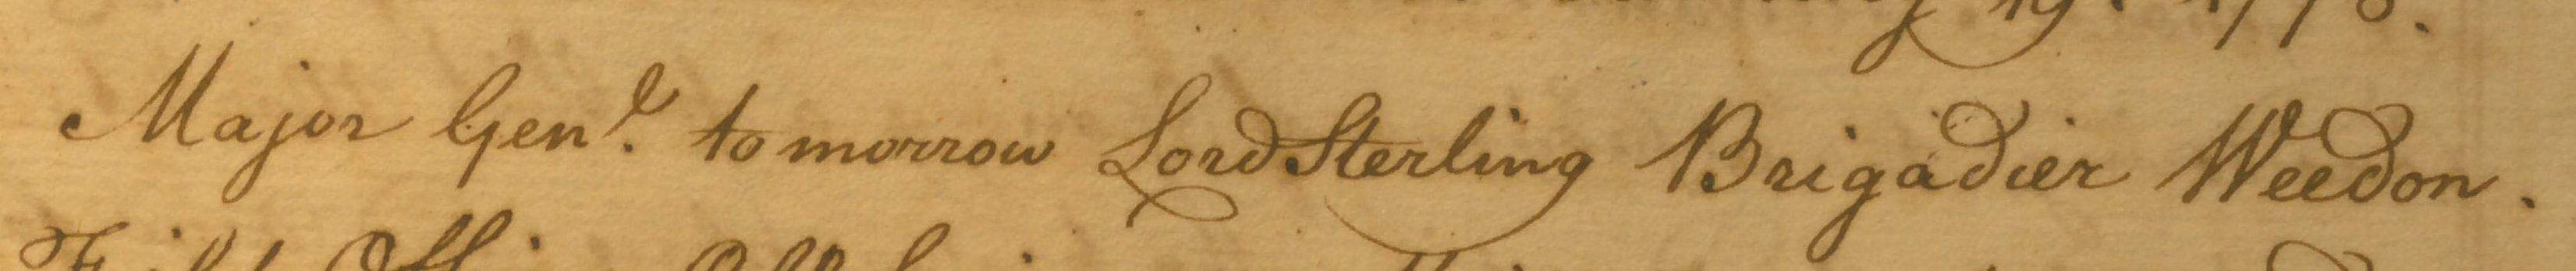Major Gen^l. tomorrow Lord Sterling Brigadier Weedon.
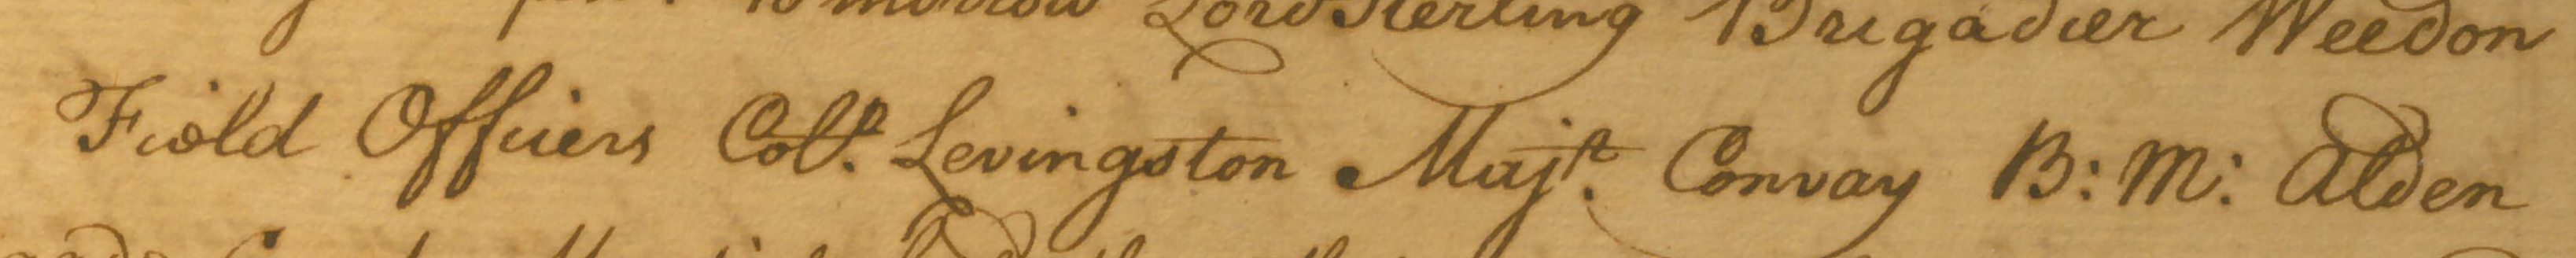Field Officers Col^o. Levingston Maj^r. Conway B: M: Alden
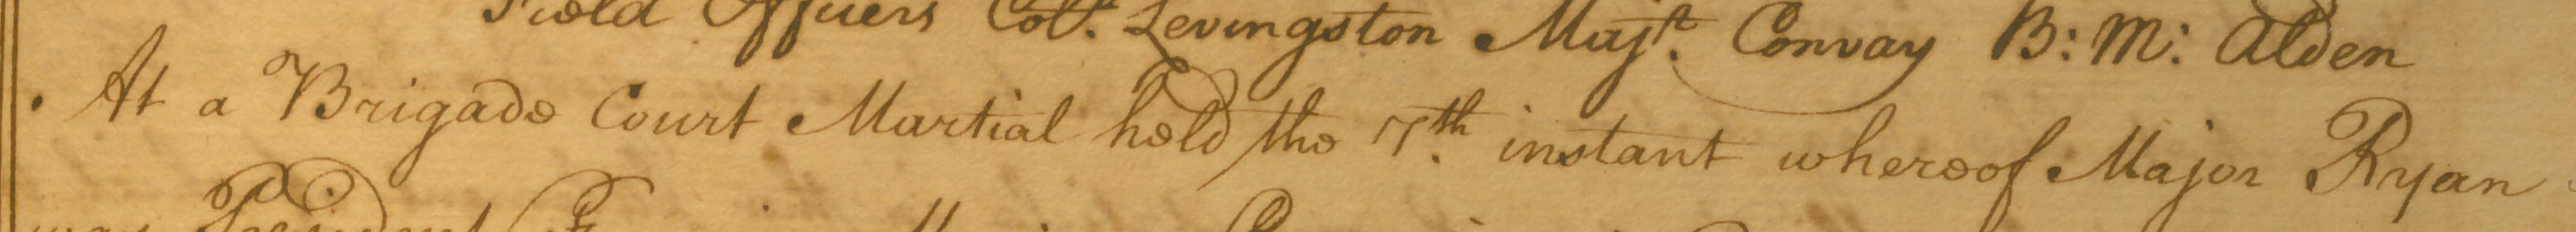At a Brigade Court Martial held the 7^th. instant whereof Major Ryan
